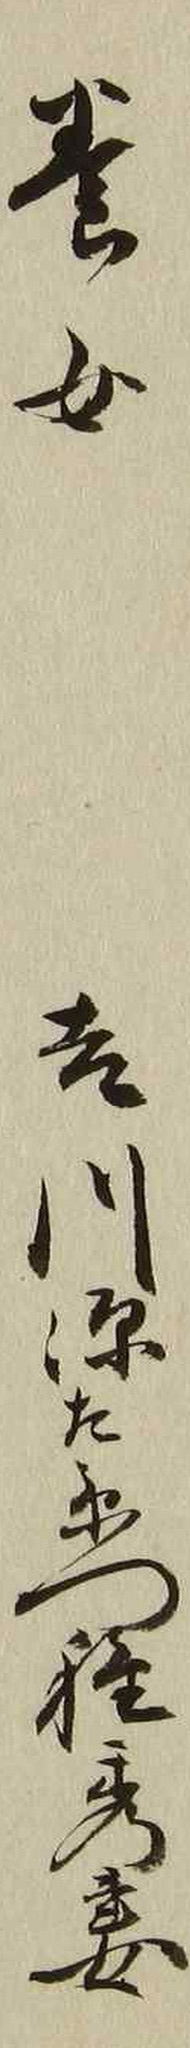養女吉川源左衛門種秀妻
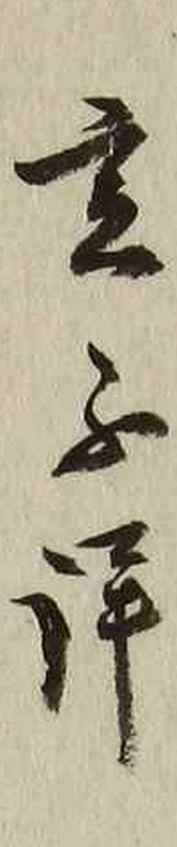実不詳
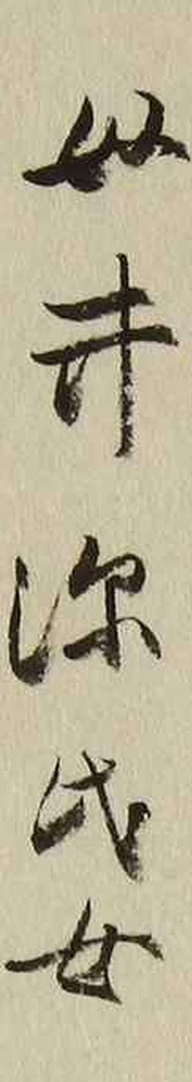母井深氏女
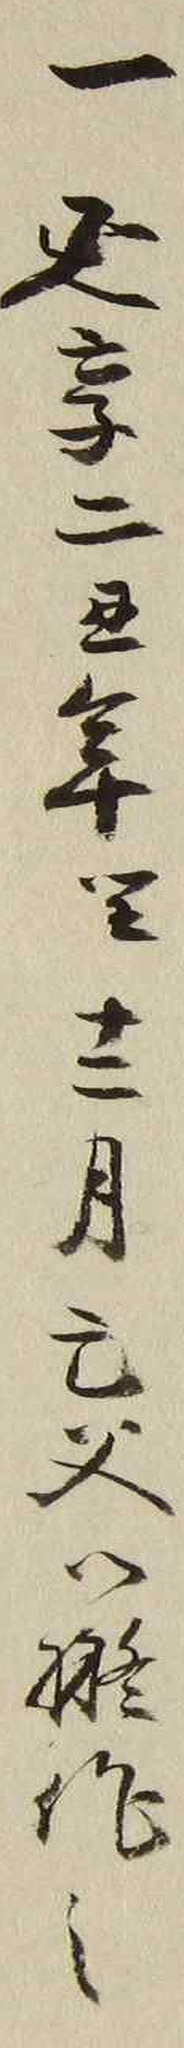一延享二丑年閏十二月亡父御擬作之
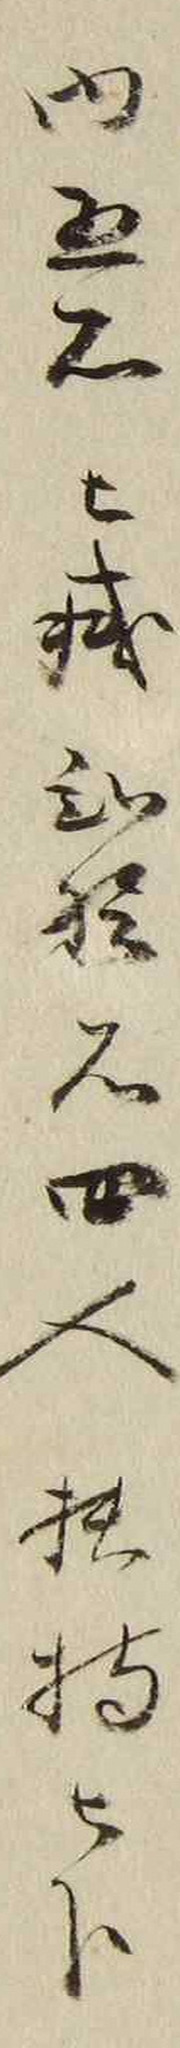内五石被減弐拾石四人扶持被下
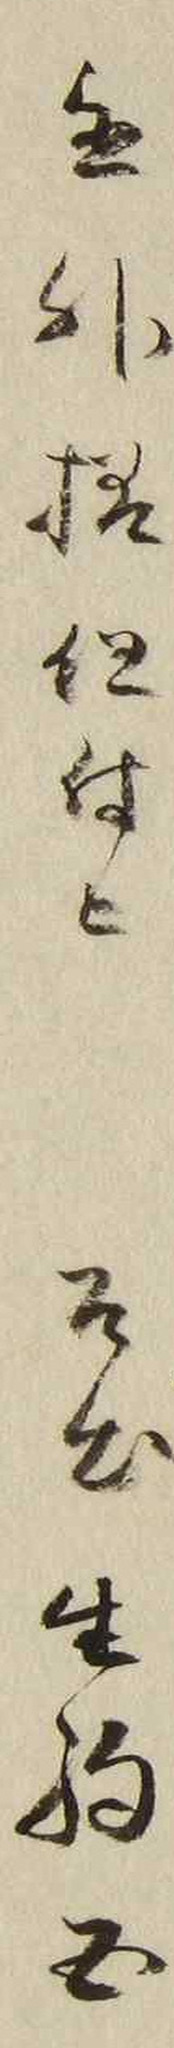置外様組付被召出生駒五

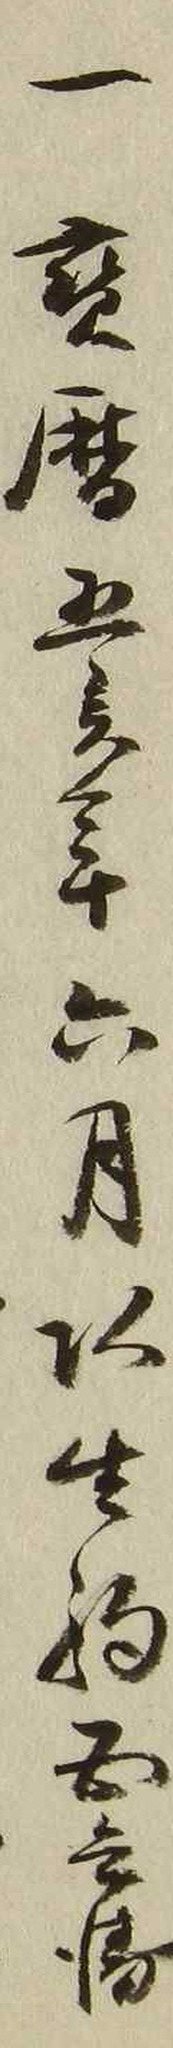一宝暦五亥年六月頭生駒五兵衛
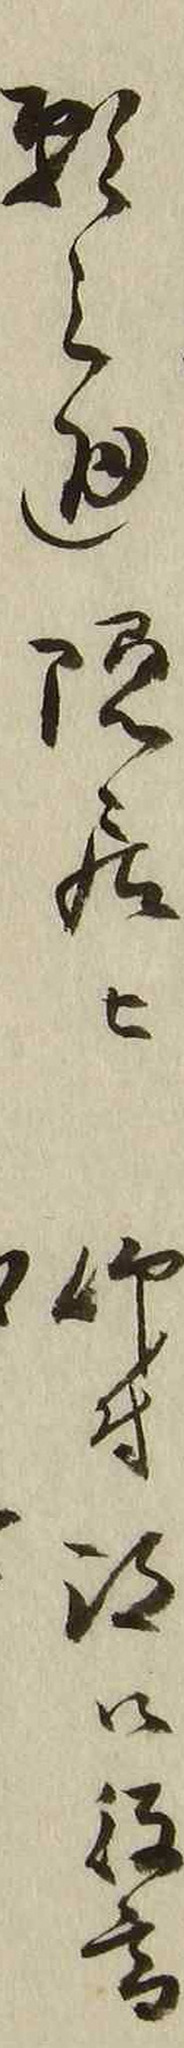願之通隠居被仰付跡御役高
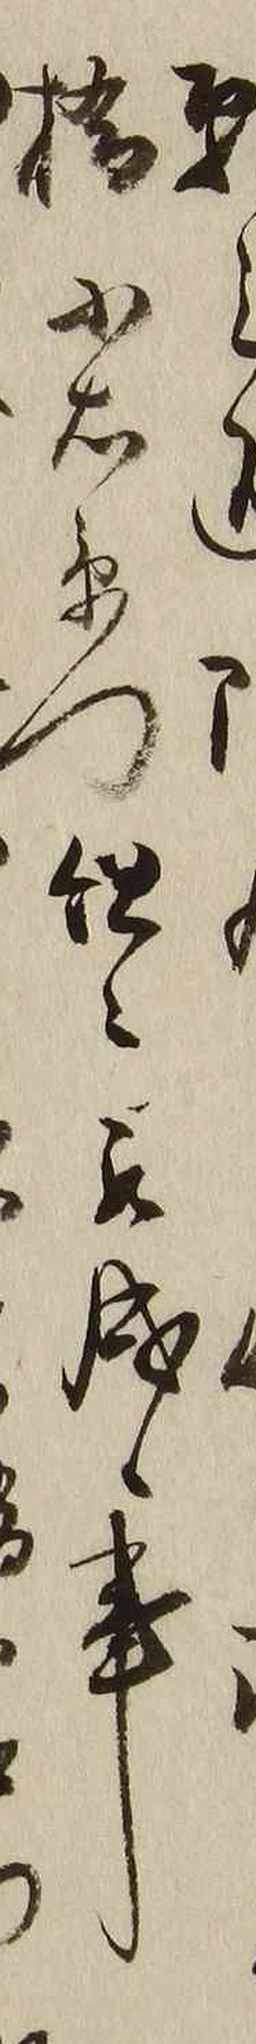橋小右衛門組ニ罷成候事
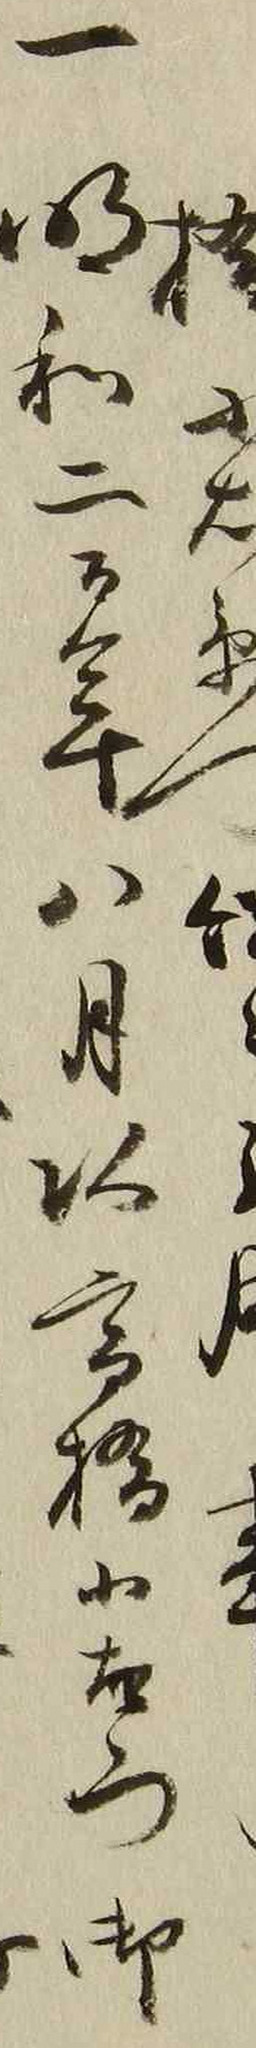一明和二酉年八月頭高橋小右衛門御
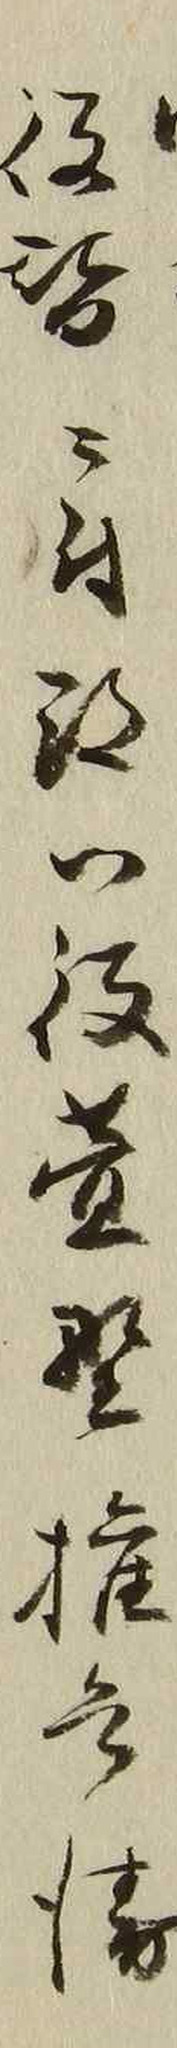役替ニ付跡御役萱野権兵衛
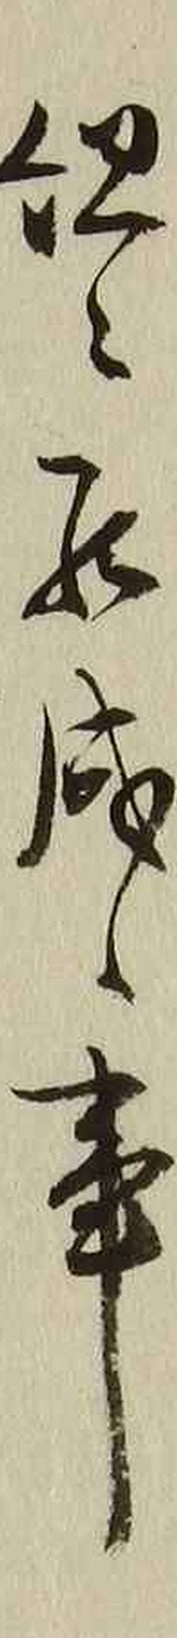組ニ罷成候事
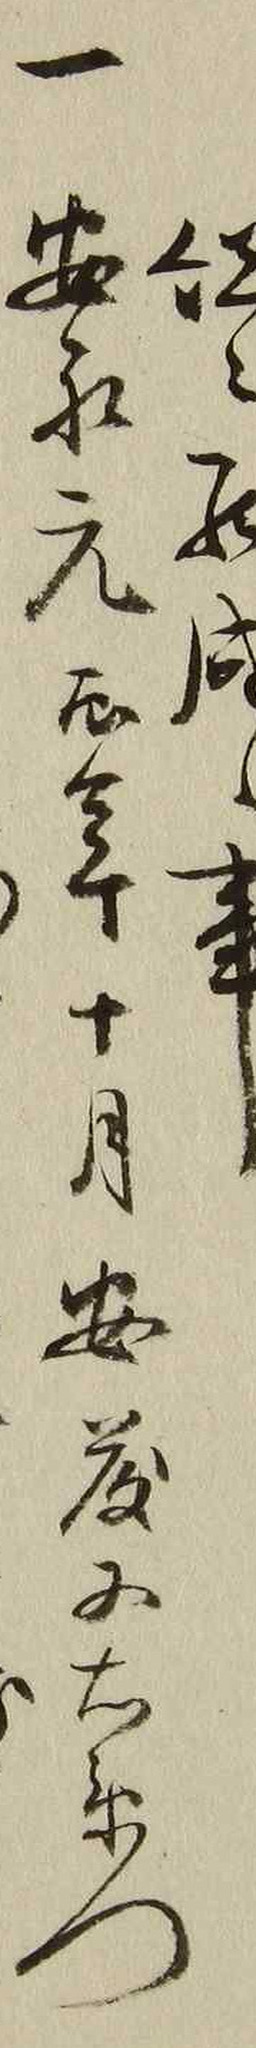一安永元辰年十月安藤五右衛門
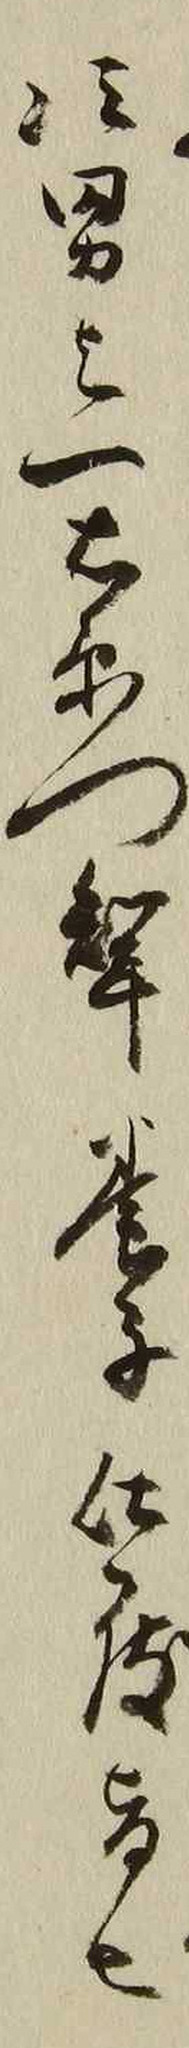次男与一右衛門聟養子仕度旨被
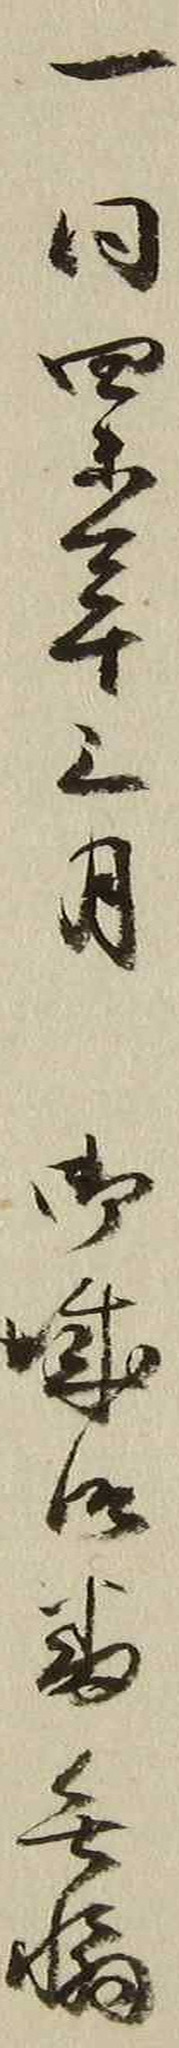一同四未年三月御城御番無懈
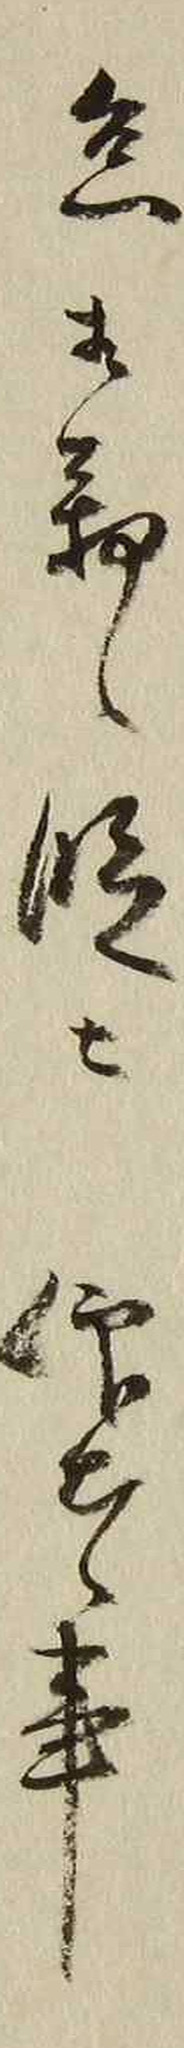怠相勤候段被仰出候事
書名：諸士系譜　巻之288　さ之部20
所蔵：会津若松市立会津図書館
